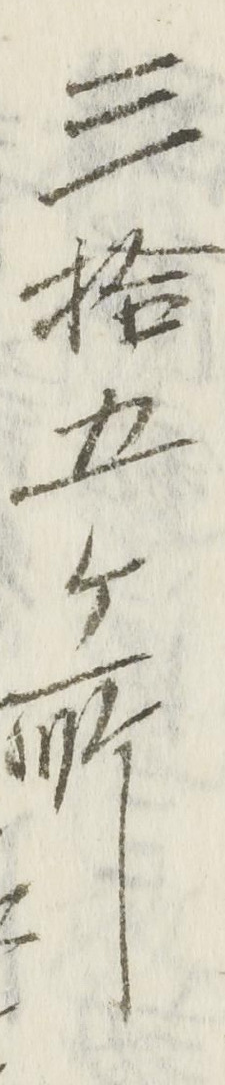三拾五ヶ所
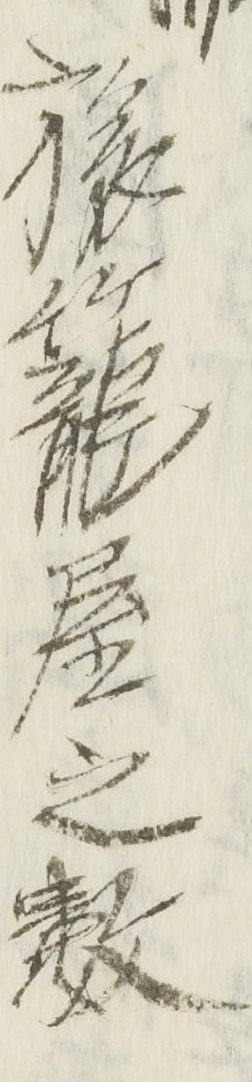旅籠屋之数
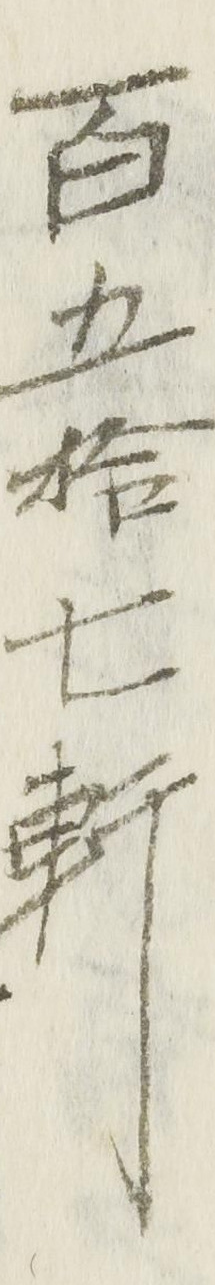百五拾七軒
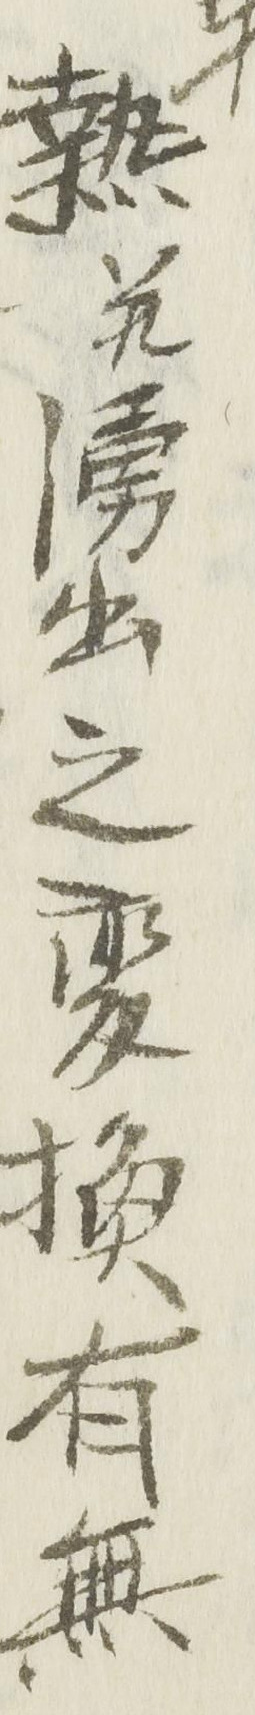熱並湧出之変換有無
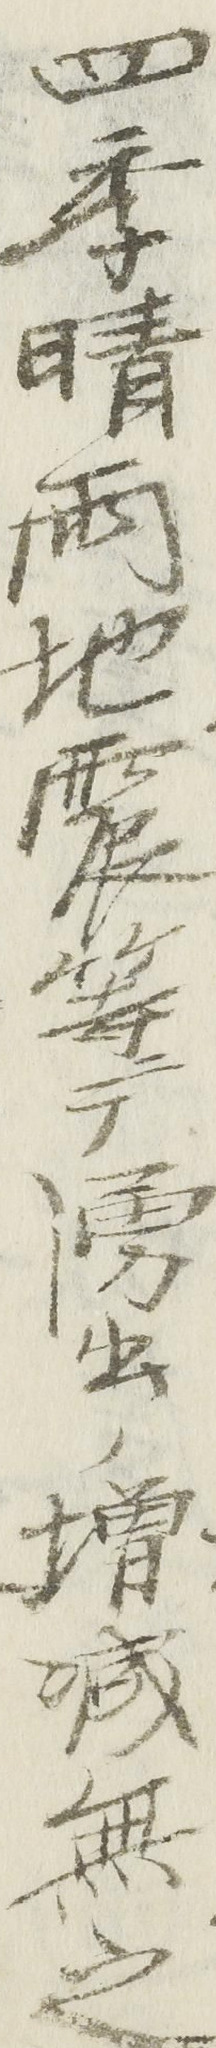四季晴雨地震等ニテ湧出ノ増減無之
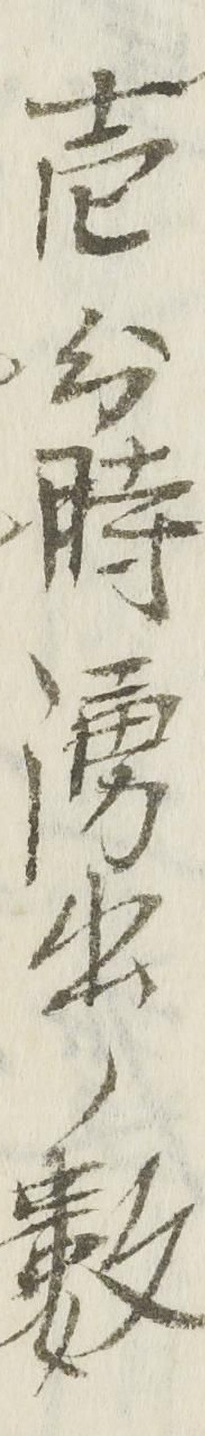壱分時湧出ノ数
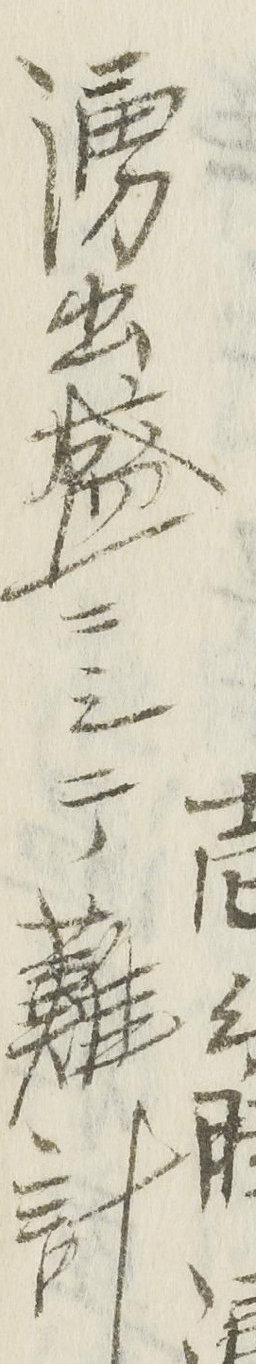湧出盛ニシテ難計

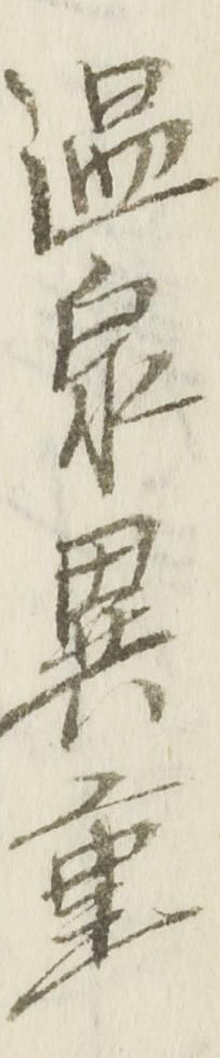温泉異重
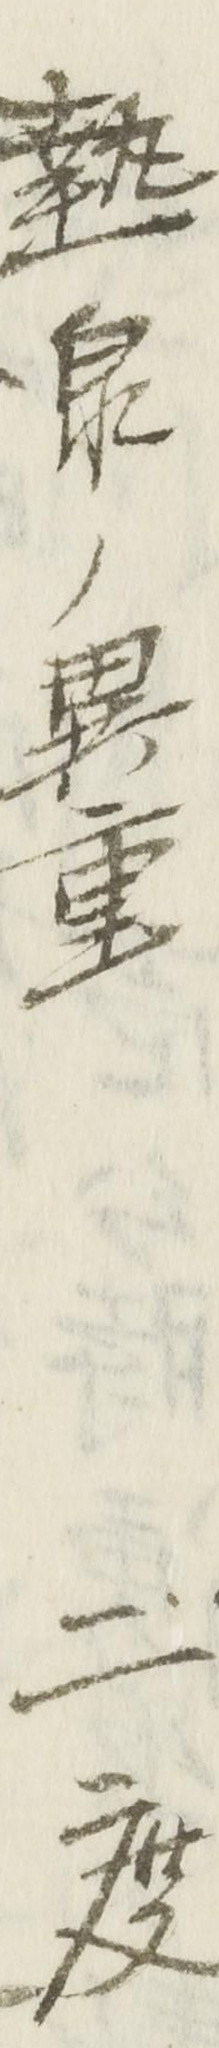熱泉ノ異重二度
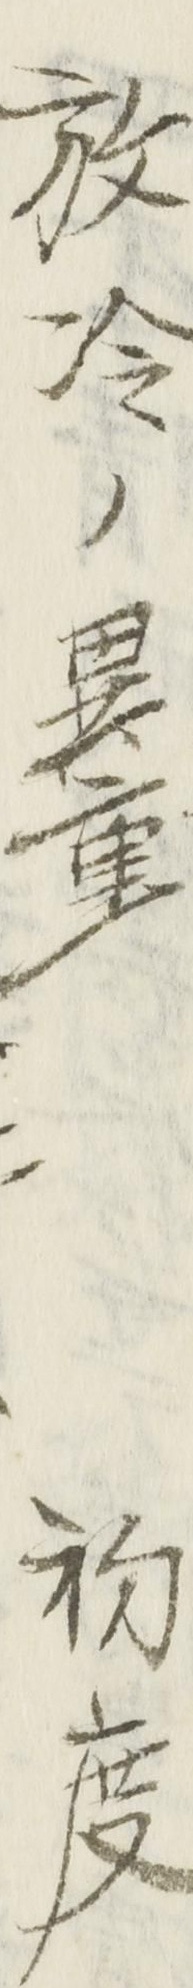放冷ノ異重初度
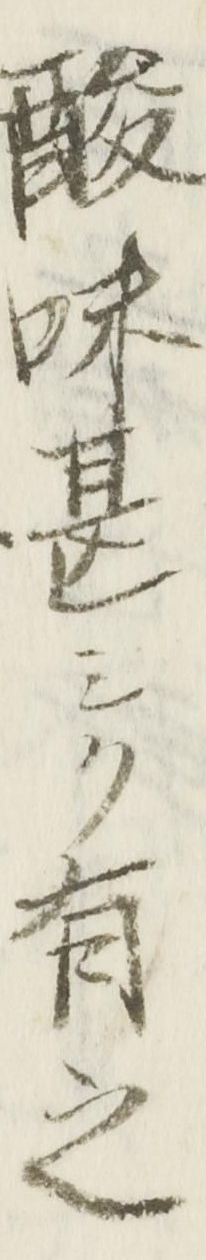酸味甚シク有之
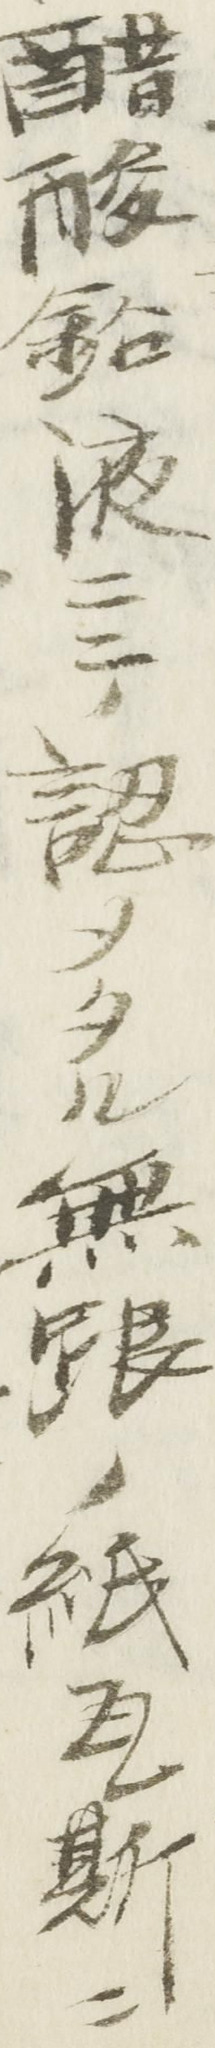酪酸鉛液ニテ認メタル無跟ノ紙瓦斯ニ
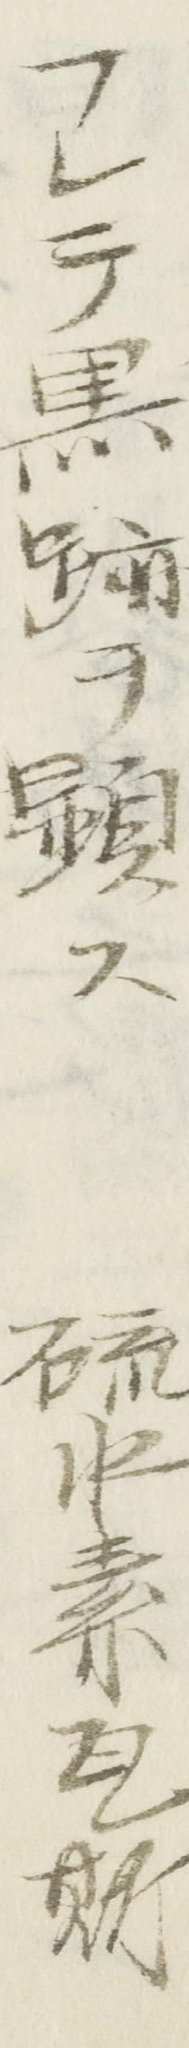フレテ黒跡ヲ顕ス硫水素瓦斯
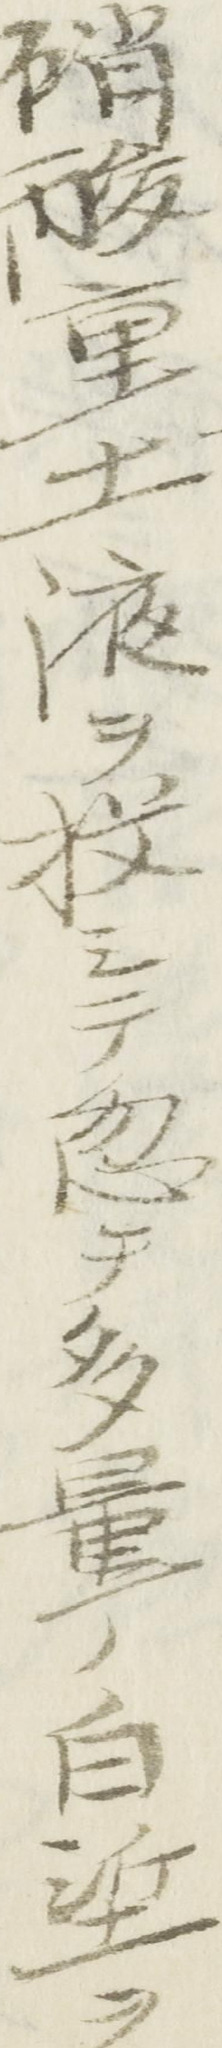硝酸土壌を投ジテ忽チ多量ノ白垽ヲ
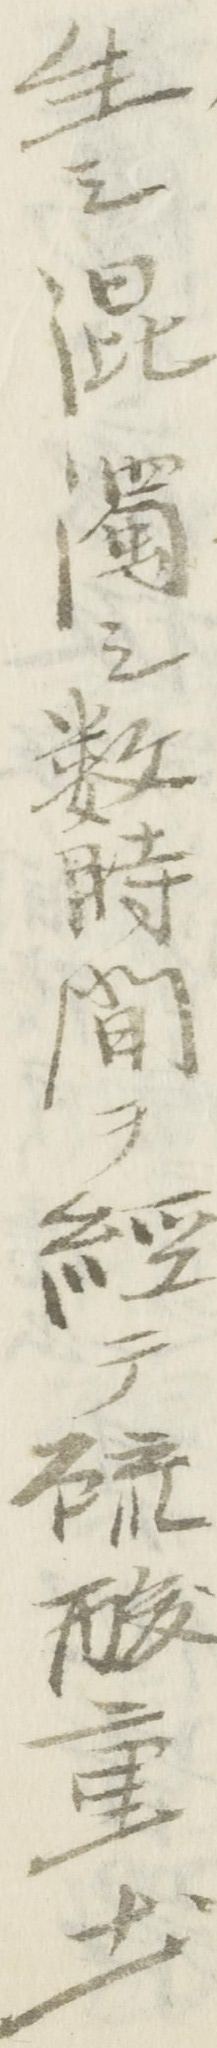生ジ混濁シ数時間ヲ経テ硫酸重土
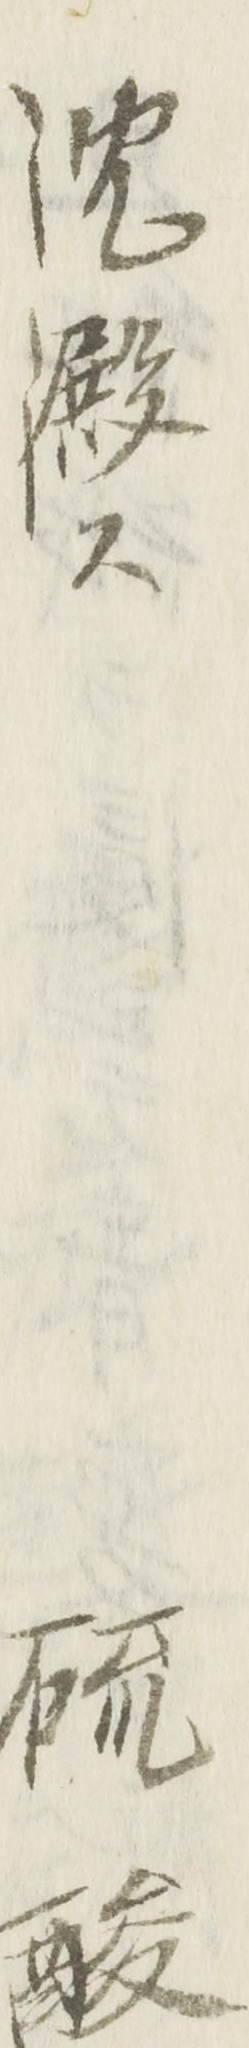沈殿ス硫酸
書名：温冷泉試験表
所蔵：東京大学地震研究所図書室 Earthquake Research Institute Library, The University of Tokyo, JAPAN
